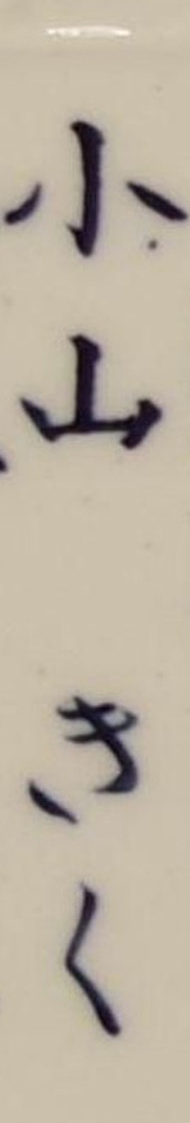小山きく
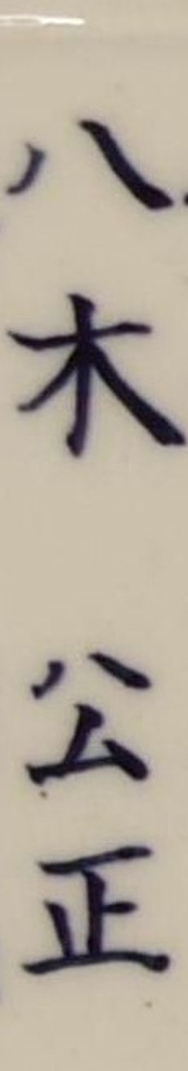八木公正
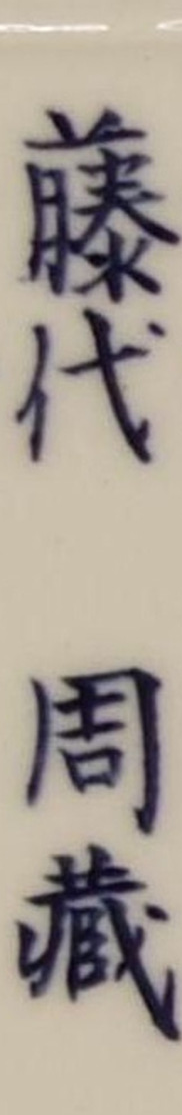藤代周蔵
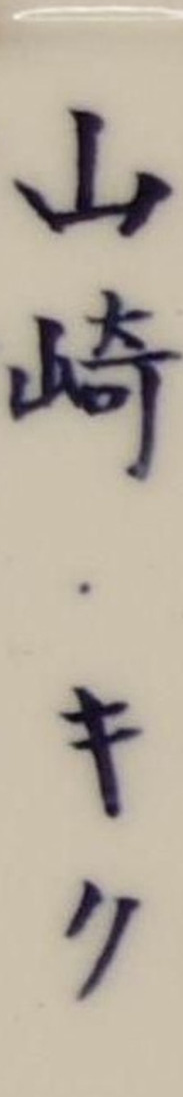山崎キク
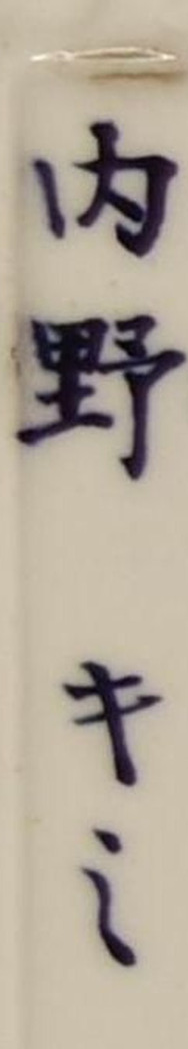内野キミ

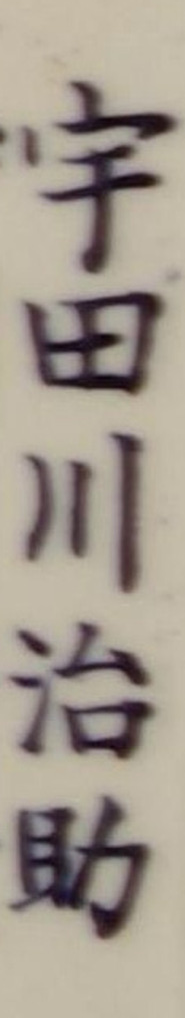宇田川治助
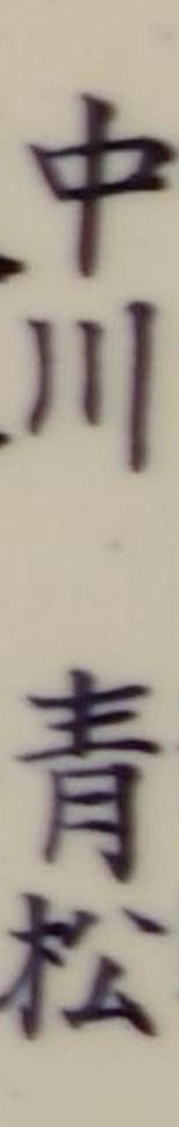中川青松
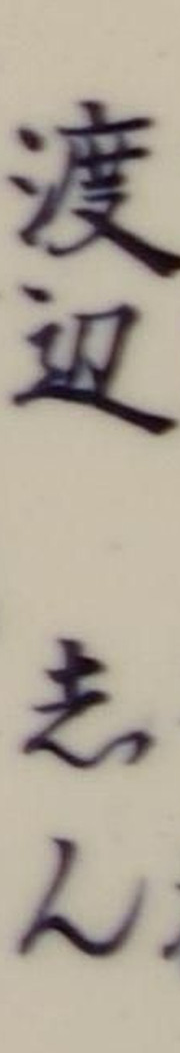渡辺しん
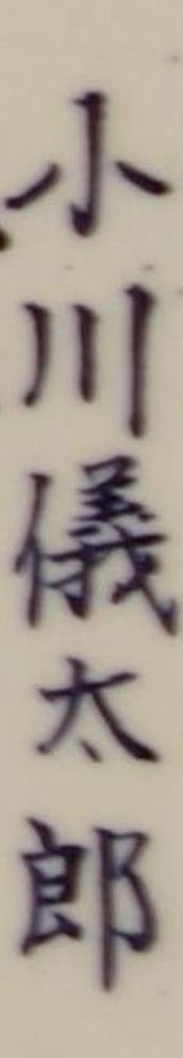小川儀太郎
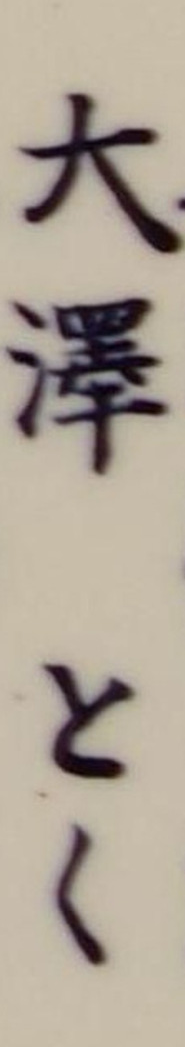大澤とく
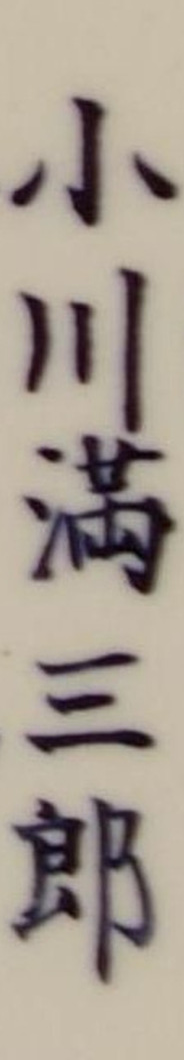小川満三郎
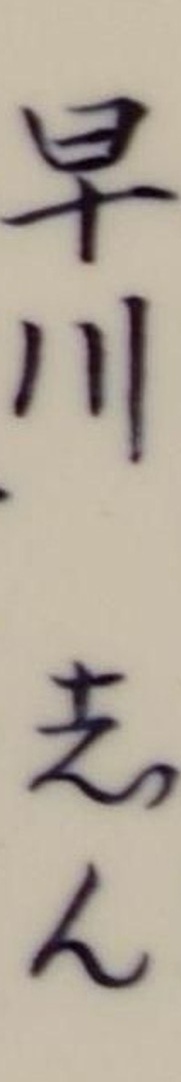早川しん
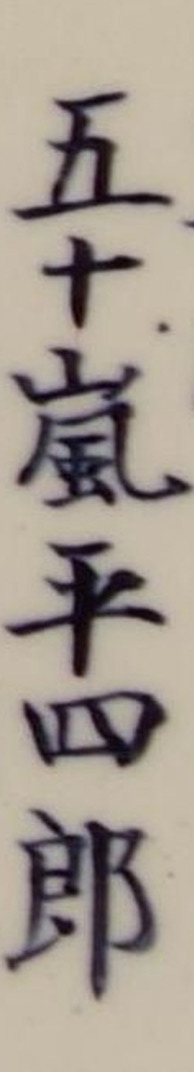五十嵐平四郎
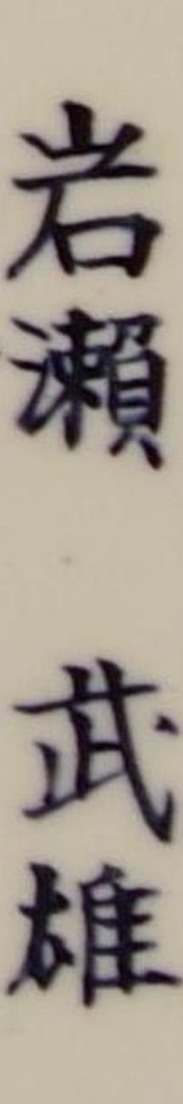岩瀬武雄
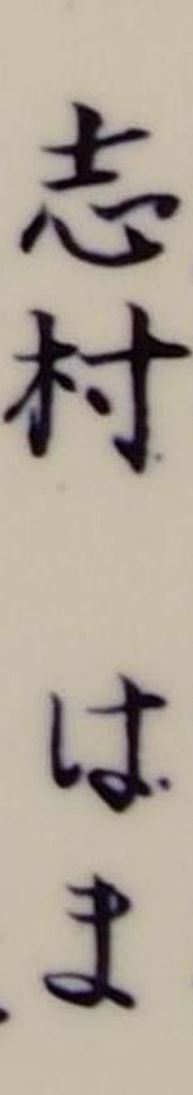志村はま
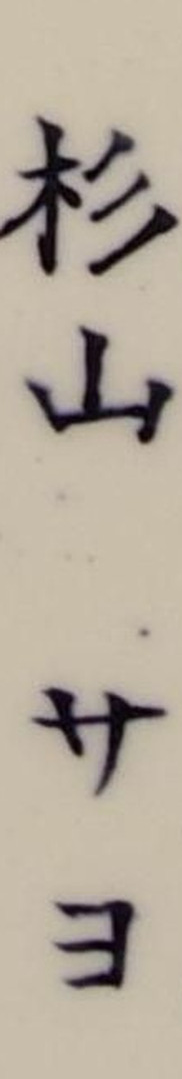杉山サヨ
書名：E~L
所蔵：高野山金剛峯寺
